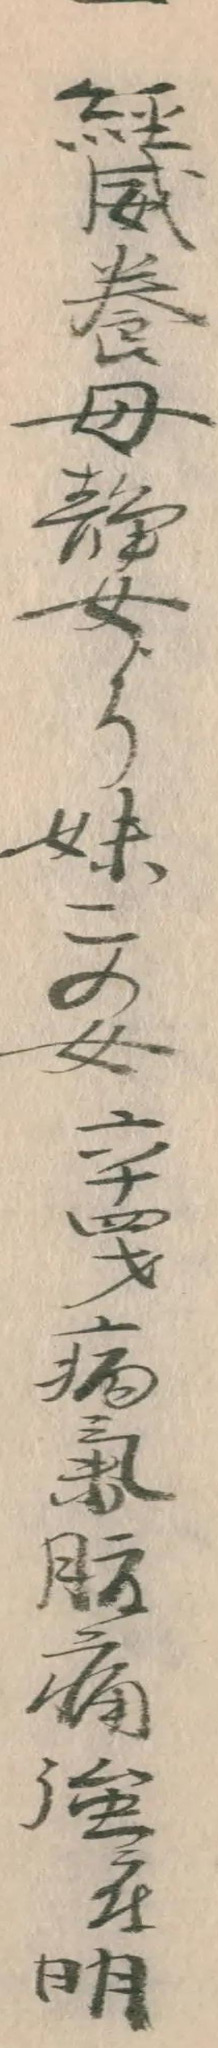一経威養母静女より妹この女六十四才病氣腹痛強ニ付明
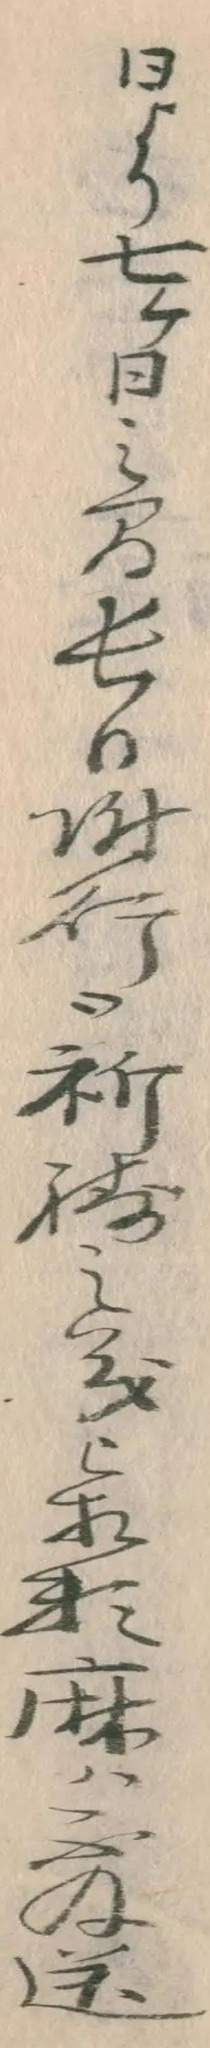日より七ケ日之間長日附行御祈祷之義被相頼麻ハ不及送云々
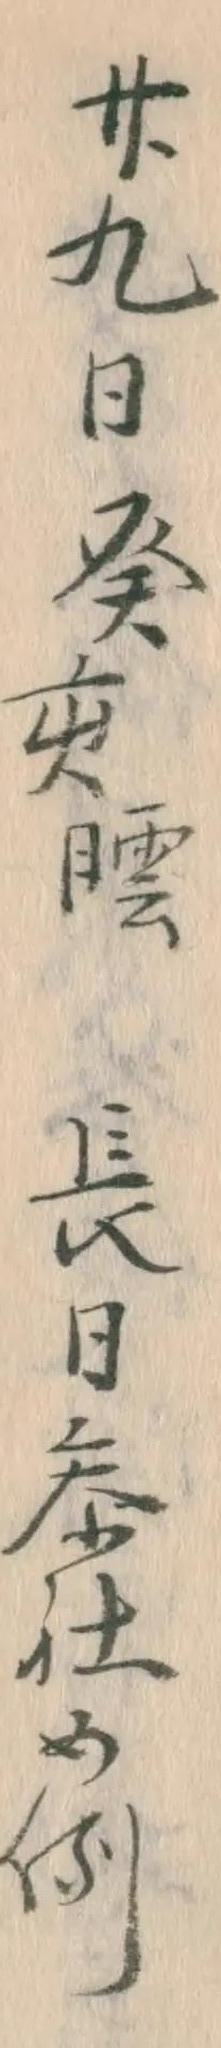廿九日癸亥曇長日参社如例
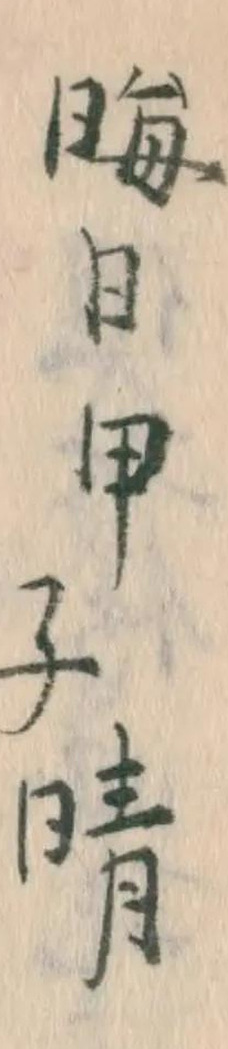晦日甲子晴
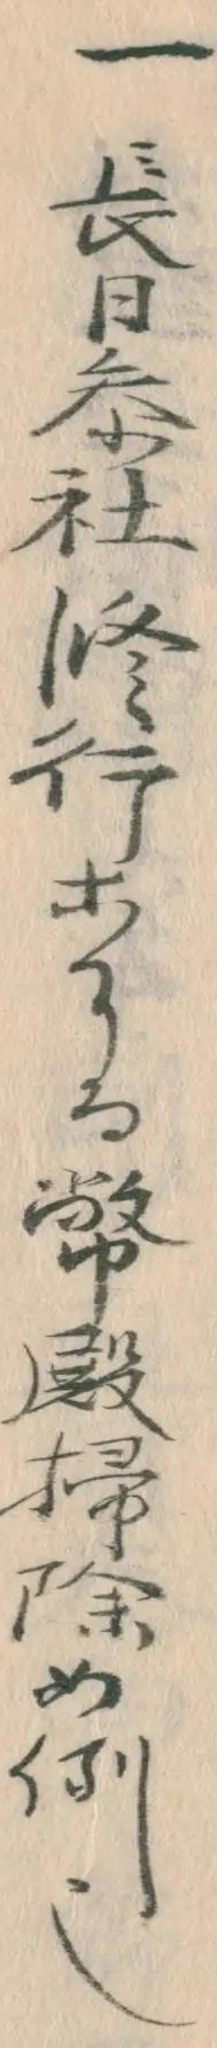一長日参社修行等了而幣殿掃除如例也
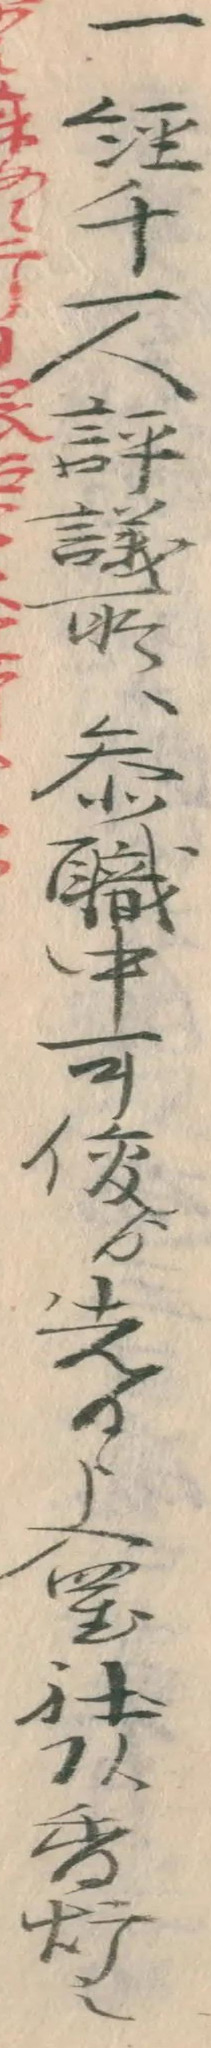一経千一人評議所へ参職中可俊ゟ先日申入置社頭香灯之
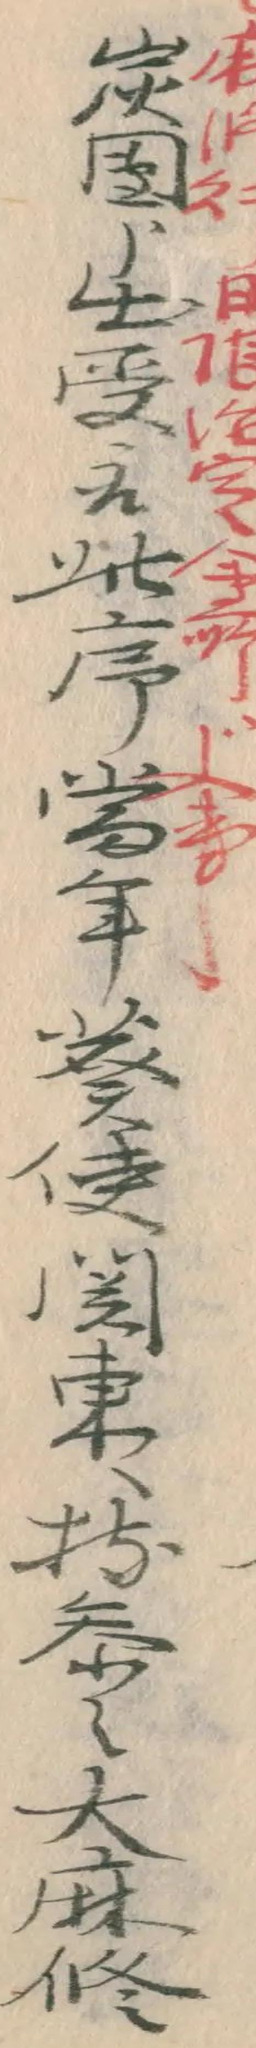炭團申出受取此序當年葵使関東へ持参之大麻修
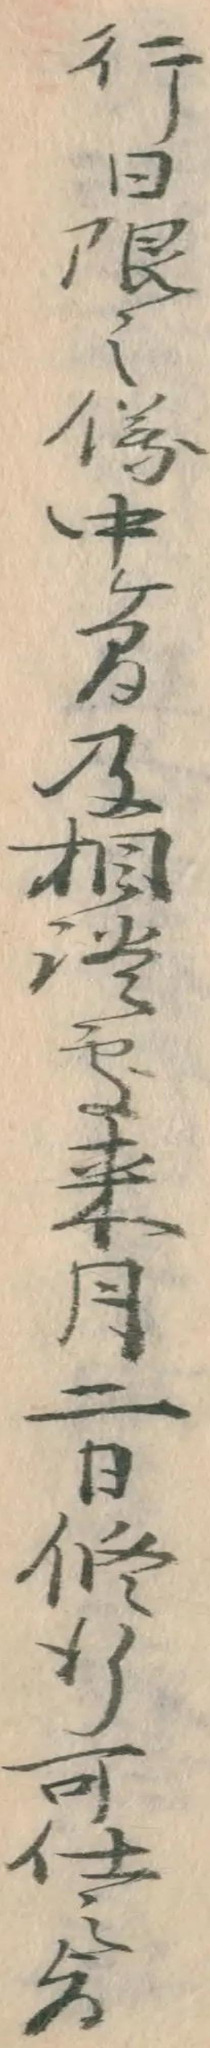行日限之儀中ヶ間及相談處来月二日修行可仕之旨

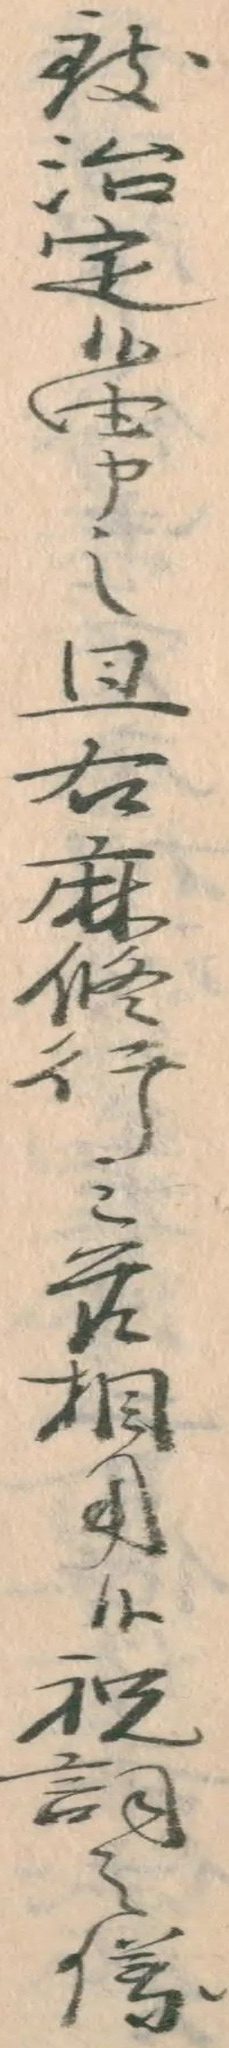致治定候由申也且右麻修行之節相用候祝詞之儀
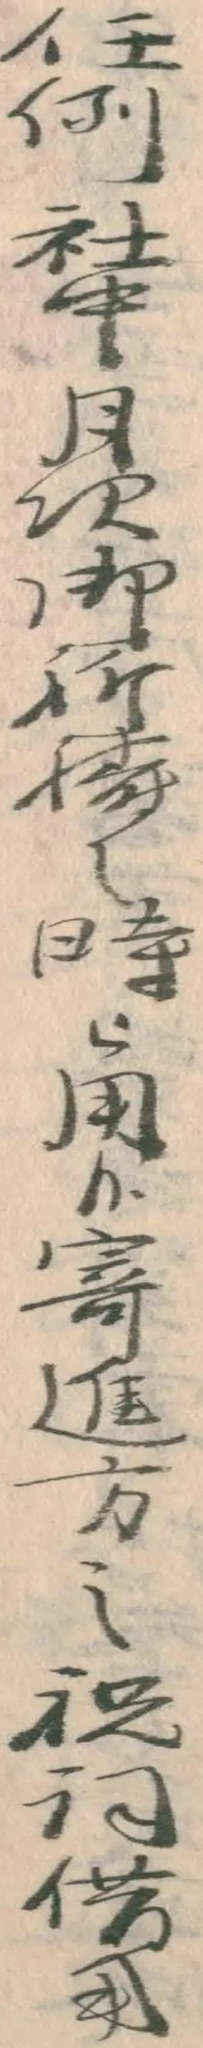任例社中月次御祈祷之時被用候寄進方之祝詞借用
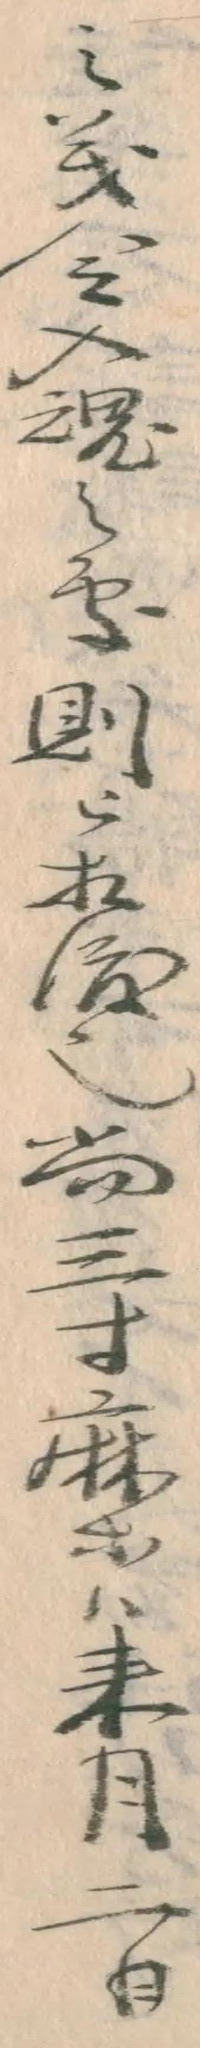之義令入魂之處則被相渡也尚三寸麻等ハ来月二日
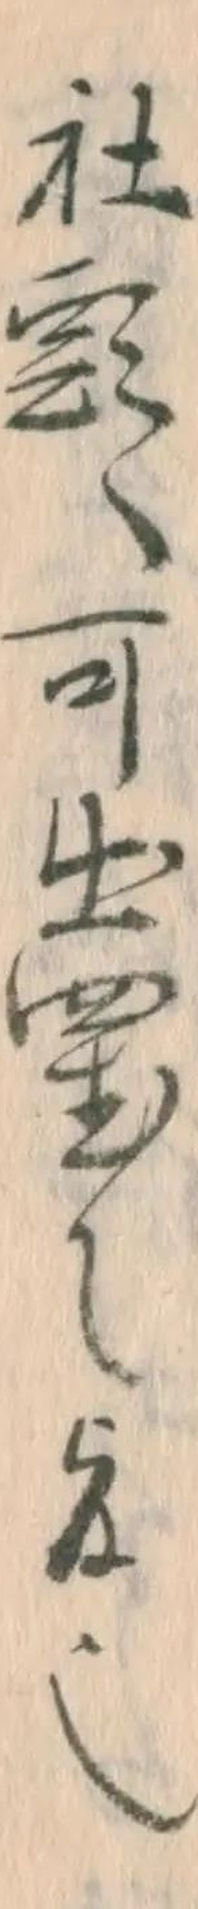社頭へ可出置之旨也
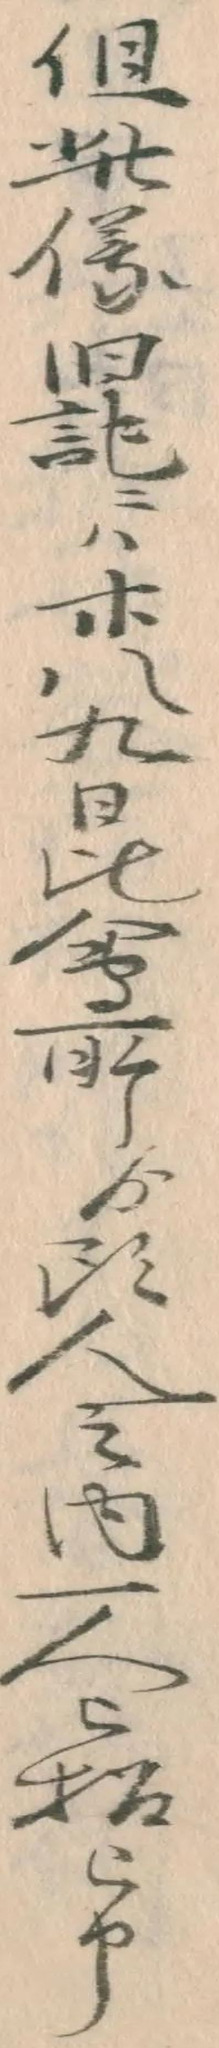但此儀旧記ニハ廿八九日比會所ゟ頭人之内一人被招被申
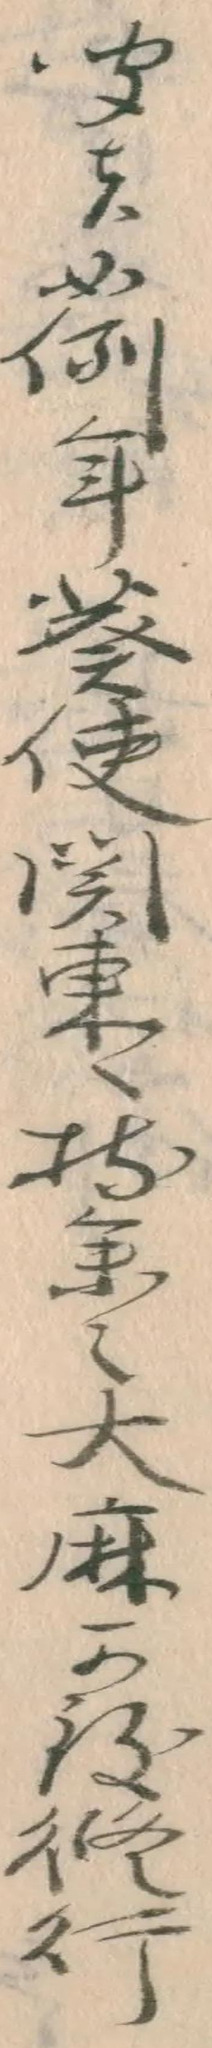聞は如例年葵使関東へ持参之大麻可致修行
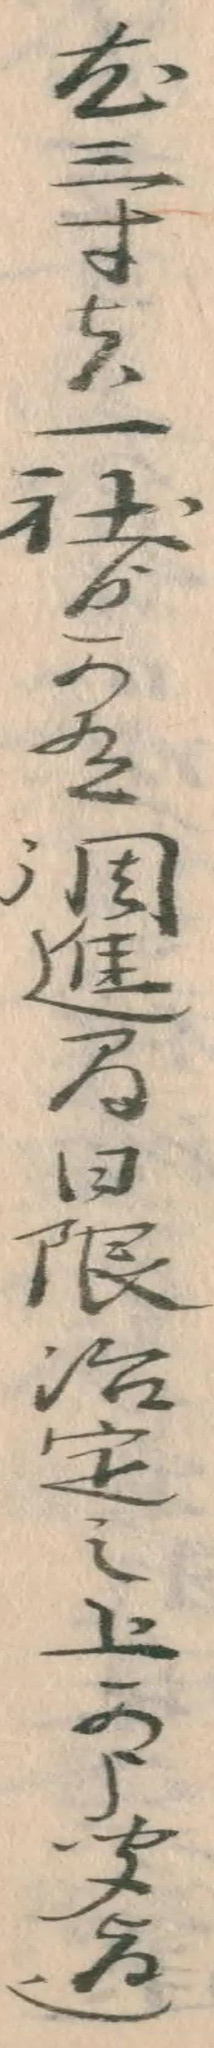尤三寸は一社ゟ可有調進間日限治定之上可申聞旨也
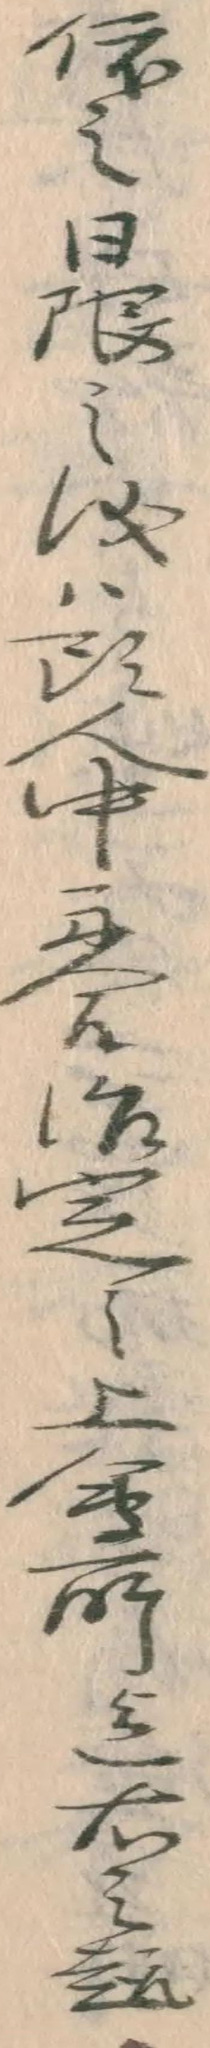依之日限之儀ハ頭人中示合治定之上會所迄右之趣
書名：賀茂社記録. 第72冊
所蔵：国立国会図書館 National Diet Library, JAPAN
